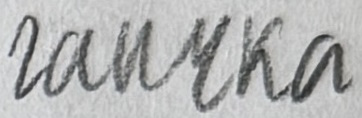гаичка
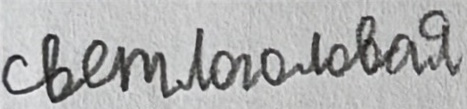светлоголовая
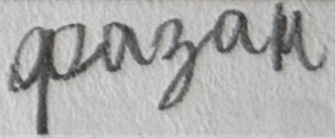фазан
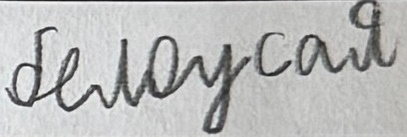белоусая
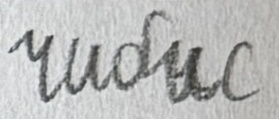чибис
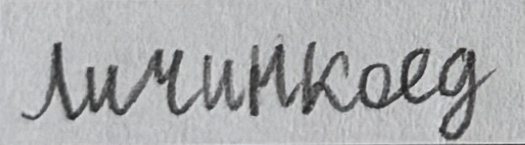личинкоед
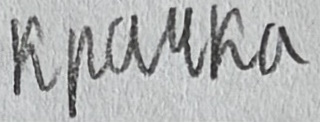крачка
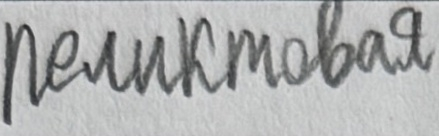реликтовая
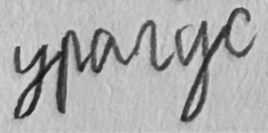урагус
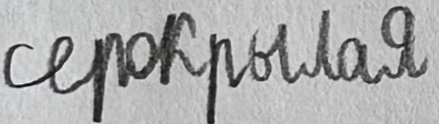серокрылая
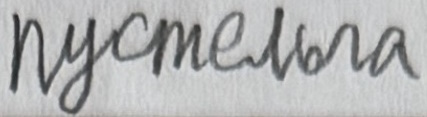пустельга
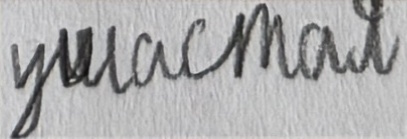ушастая
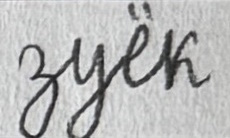зуёк
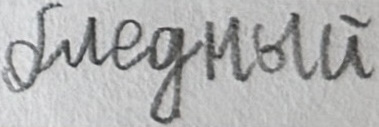бледный
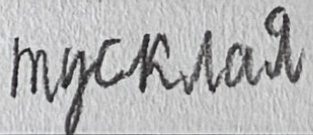тусклая
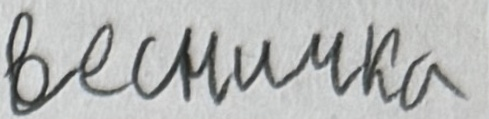весничка
